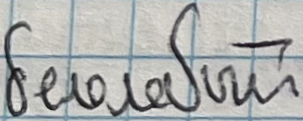белолобый
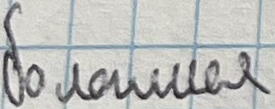болотная
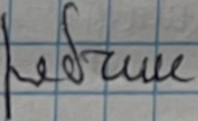рябчик
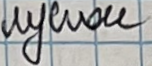луток
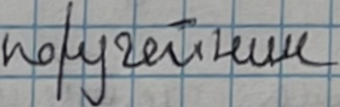поручейник
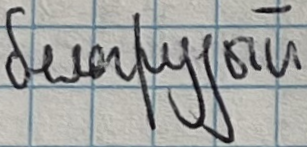белогрудый
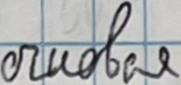очковая
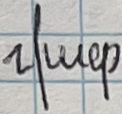гриф
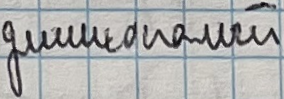длиннопалый
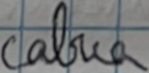савка
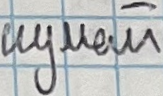кумай
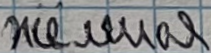жёлтая
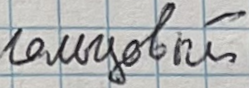гольцовый
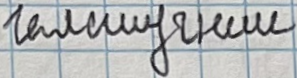галстучник
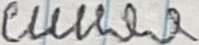синяя
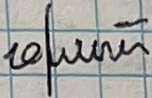горлый
